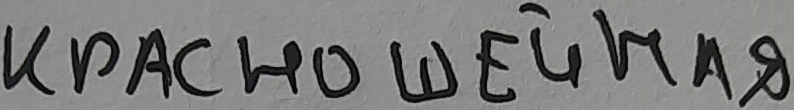красношейная
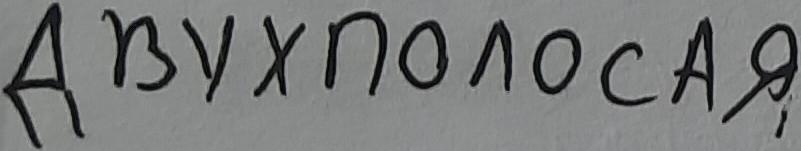двухполосая
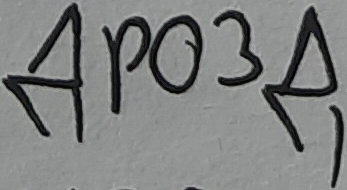дрозд
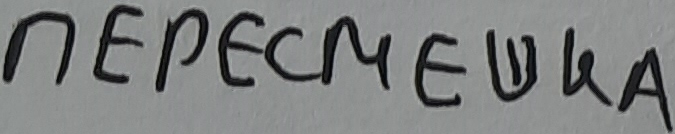пересмешка
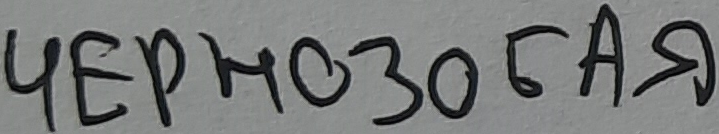чернозобая
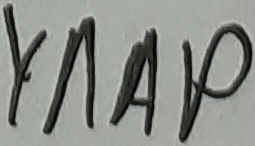улар
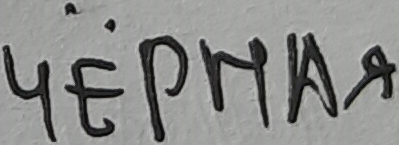чёрная
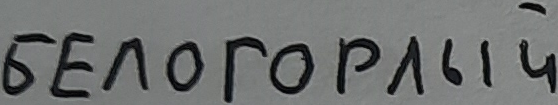белогорлый
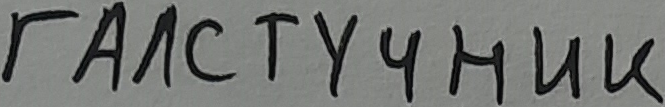галстучник
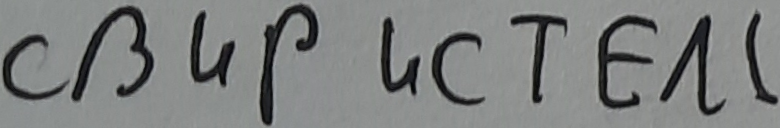свиристель
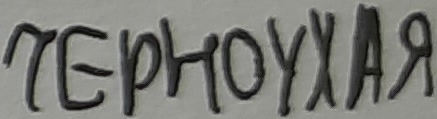черноухая
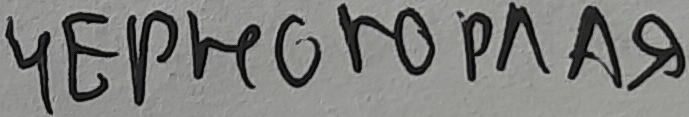черногорлая
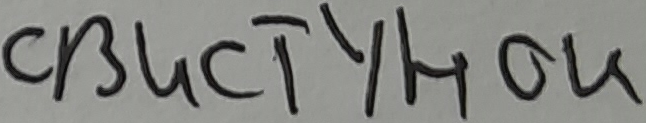свистунок
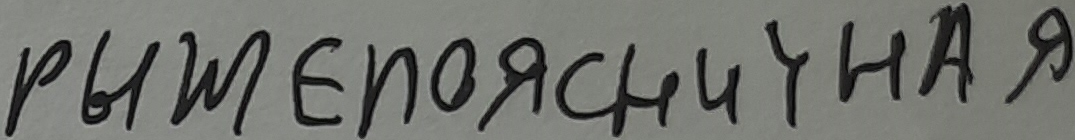рыжепоясничная
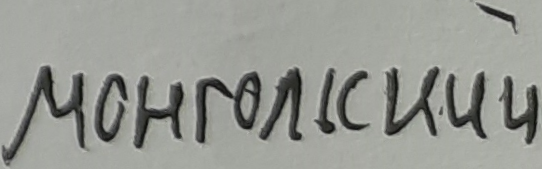монгольский
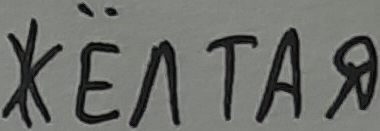жёлтая
